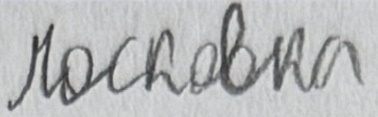московка
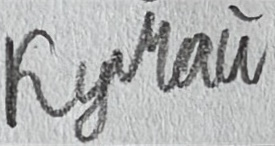кумай
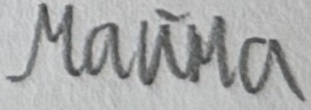майна
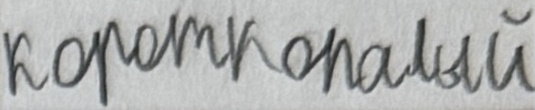короткопалый
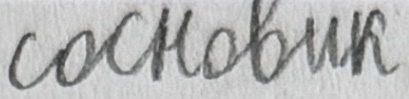сосновик
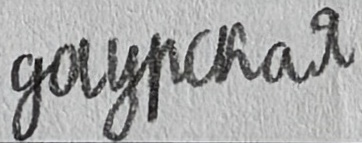даурская
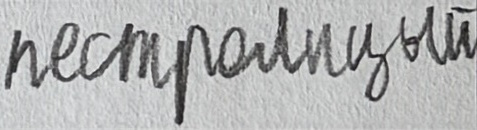пестролицый
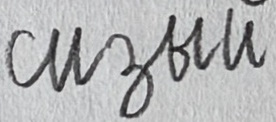сизый
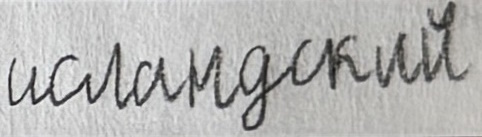исландский
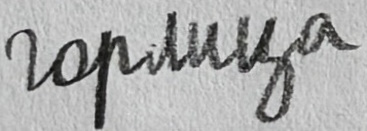горлица
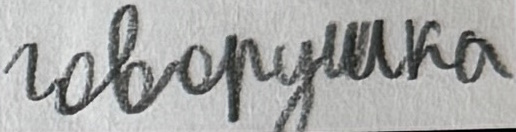говорушка
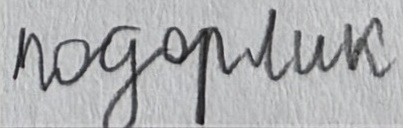подорлик
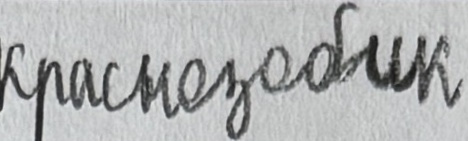краснезобик
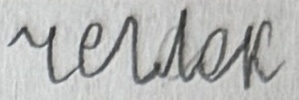чеглок
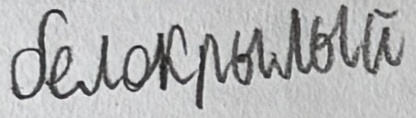белокрылый
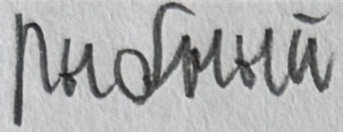рыбный
